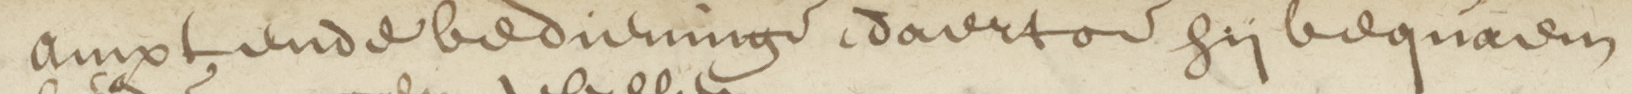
Ampt ende bedieninge, daertoe hij bequaem
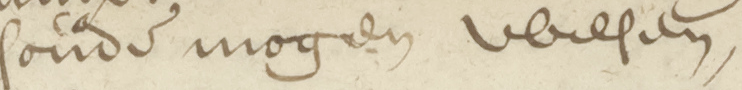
soude mogen wesen.
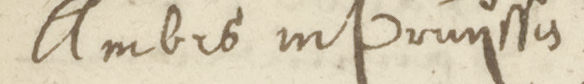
Ambrs. in Pruijssen
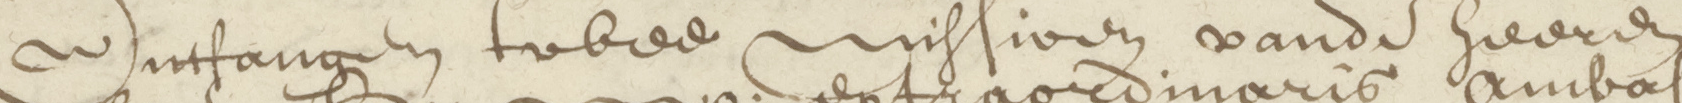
Ontfangen twee Missiven vande heeren
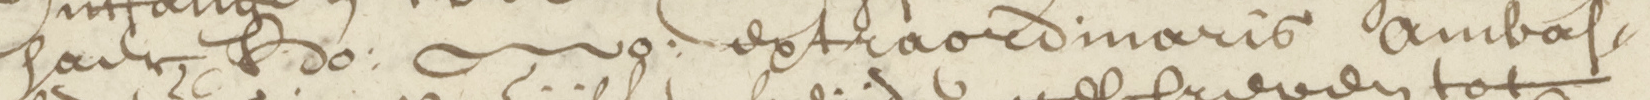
haer Ho:Mo: extraordinaris Ambas„
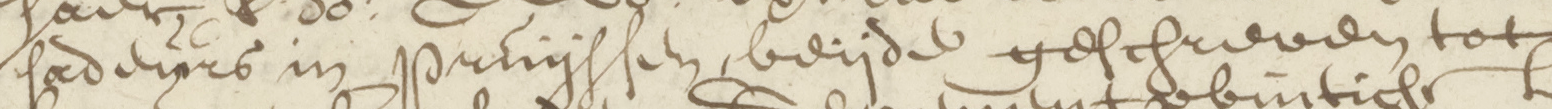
sadeurs in Pruijssen beijde geschreven tot
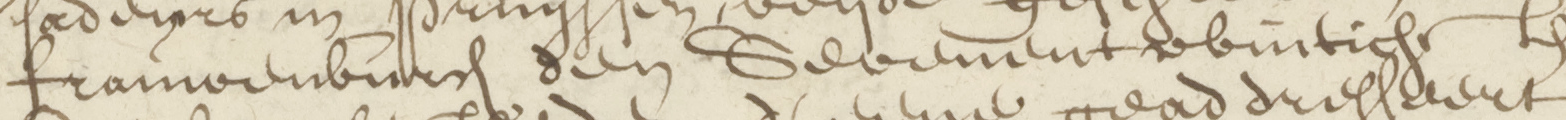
Frauwenburch den Sevenentwintichsten
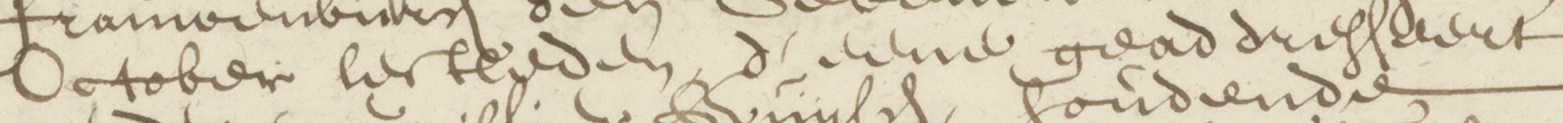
October lestleden, d‛ eene geaddresseert
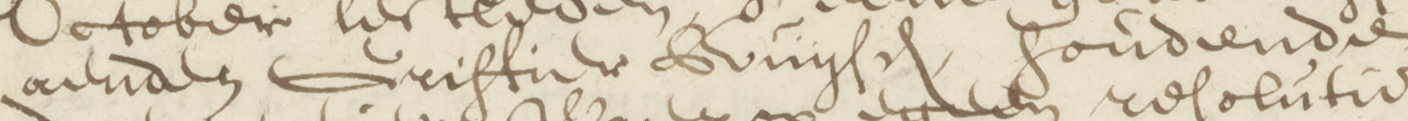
aenden Griffier Ruijsch, houdende
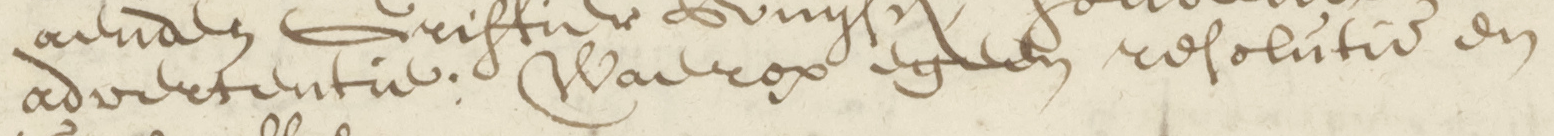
advertentie: Waerop egeen resolutie en
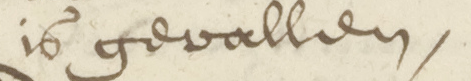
is gevallen.
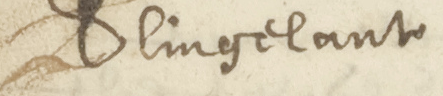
Slingelant
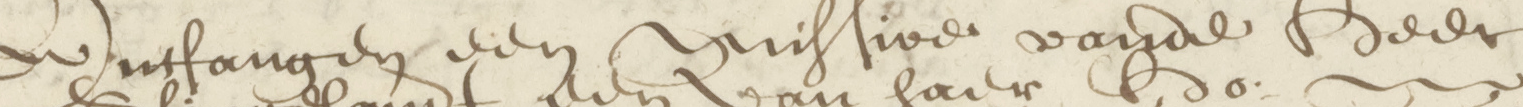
Ontfangen een Missive vande Heer
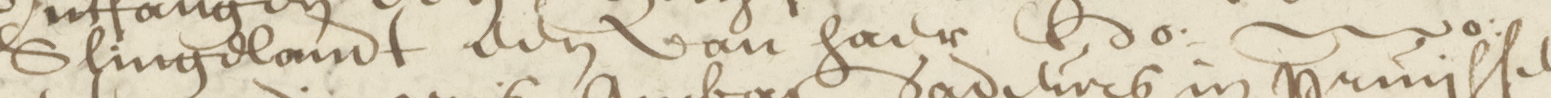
Slingelandt een van haer Ho:Mo:
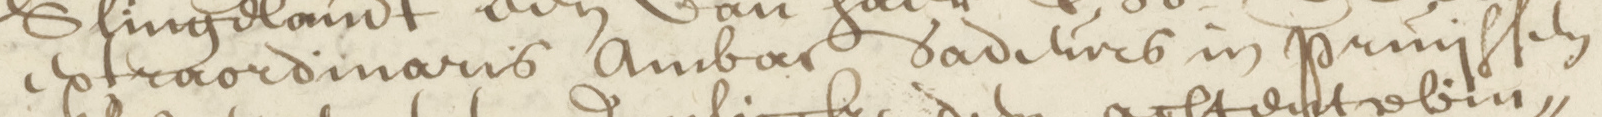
extraordinaris Ambassadeurs in Pruijssen
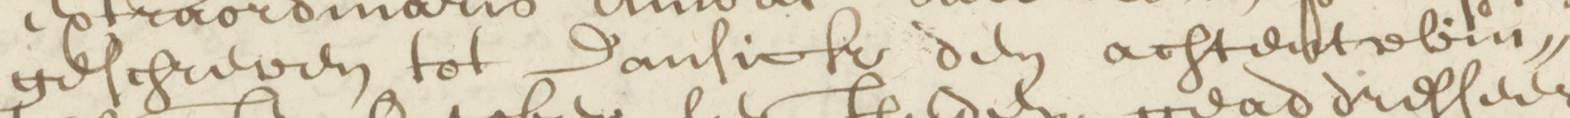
geschreven tot Dansick den achtentwin„
